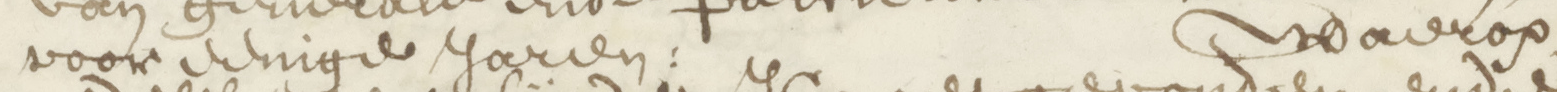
voor eenige Jaren: Waerop
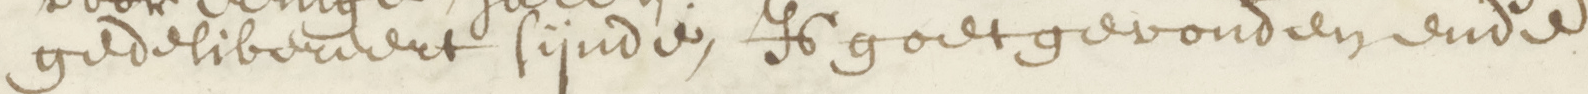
gedelibereert sijnde, Is goetgevonden ende
